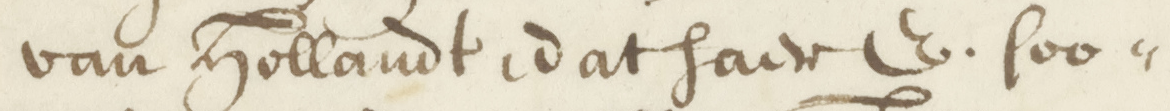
van Hollandt, dat haer E. soo„
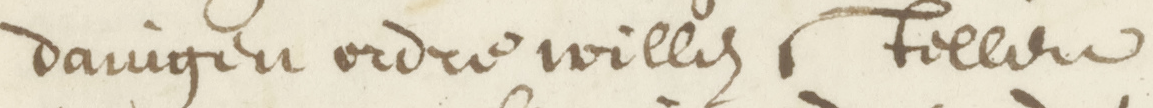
danigen ordre willen stellen
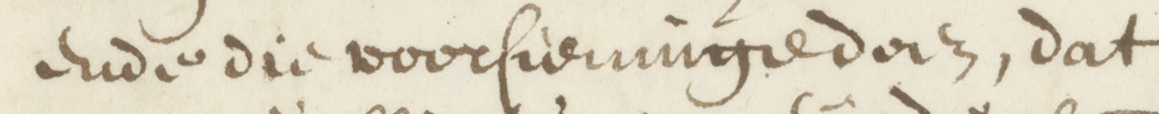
ende die voorsieninge doen, dat
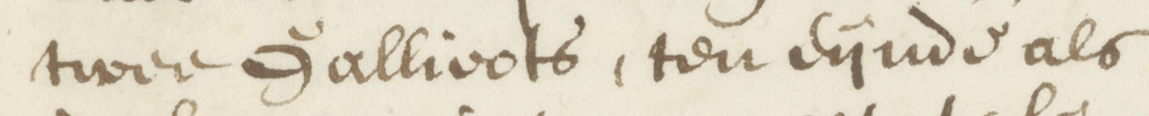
twee Gallioots, ten eijnde als
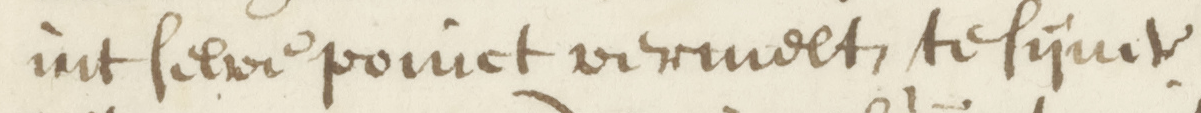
int selve poinct vermelt, te sijner
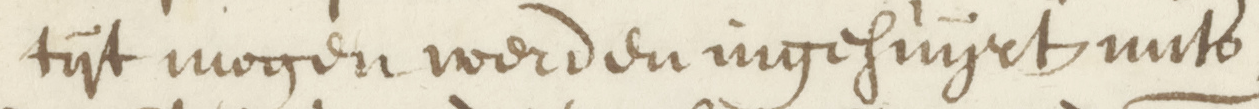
tijt mogen werden ingehuijrt, mits
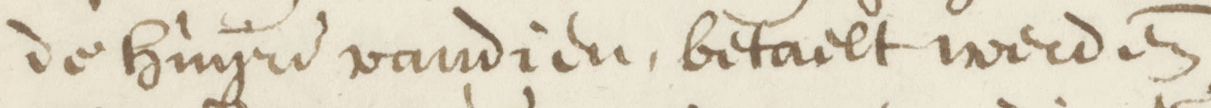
de huijre vandien, betaelt werden
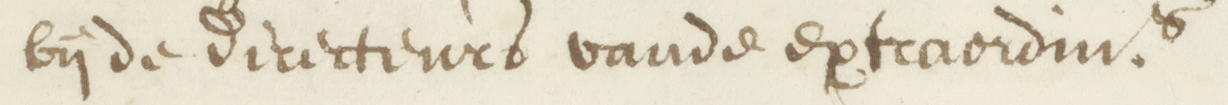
bijde Directeurs vande extraordins.
